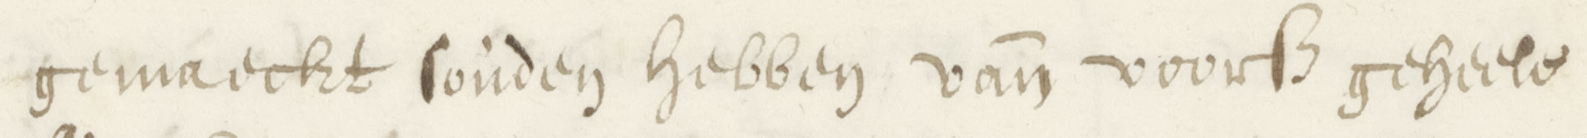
gemaeckt souden hebben van voors geheele
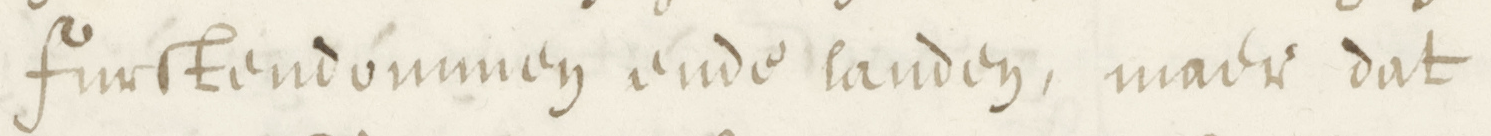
furstendommen ende landen, maer dat
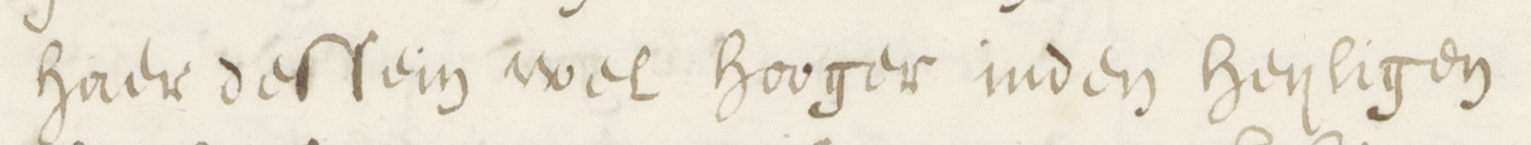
haer dessein wel hooger inden heyligen
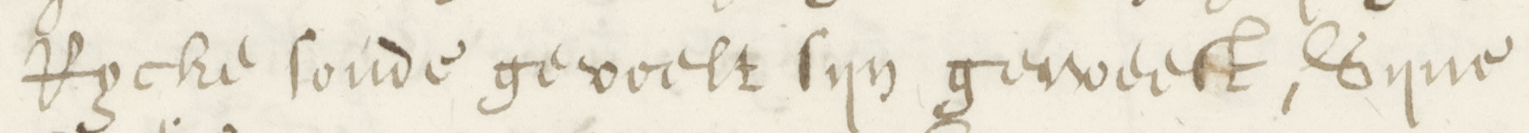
Rycke soude gevoelt sijn geweest, Syne
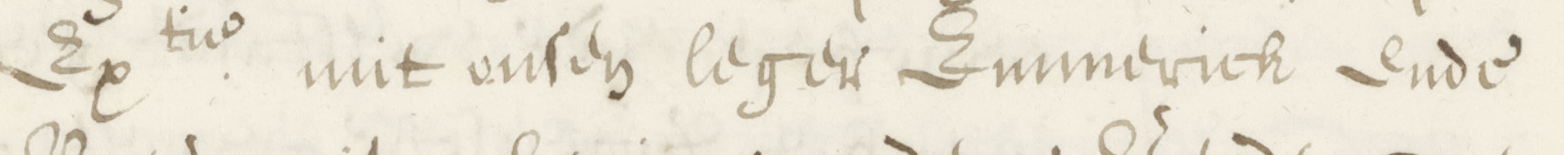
Extie. mit onsen leger Emmerick ende
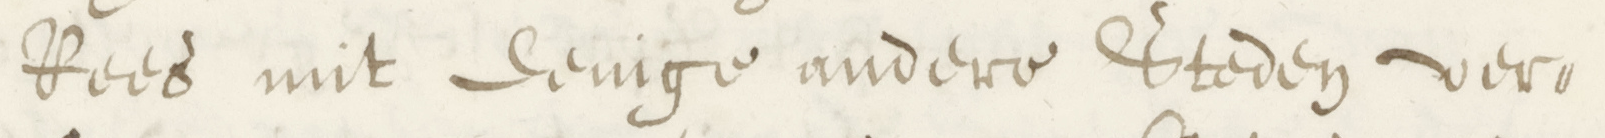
Rees mit Eenige andere Steden ver„
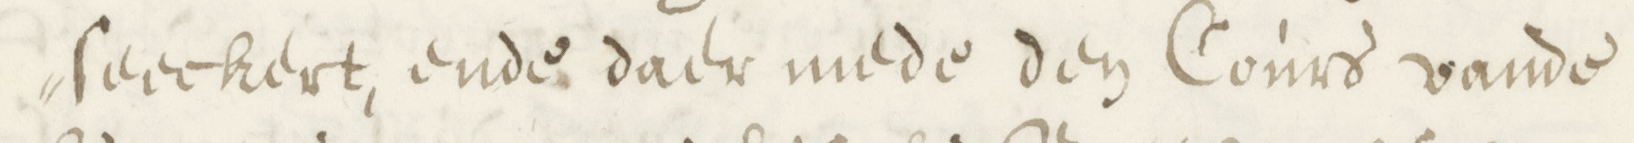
,,seeckert, ende daer mede den Cours vande
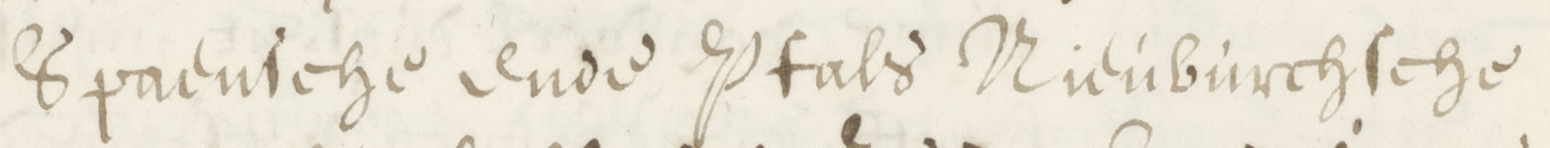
Spaensche ende Pfals Nieuburchsche
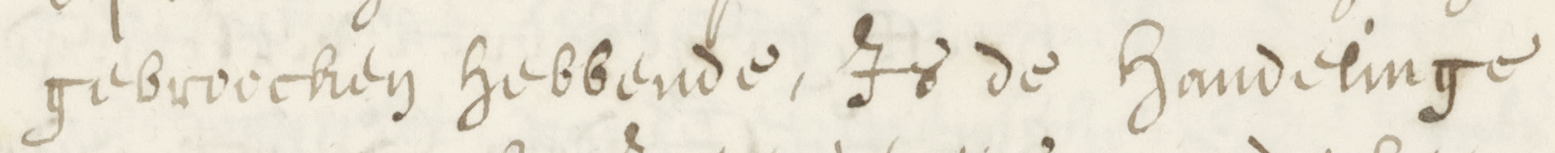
gebroocken hebbende, Is de handelinge
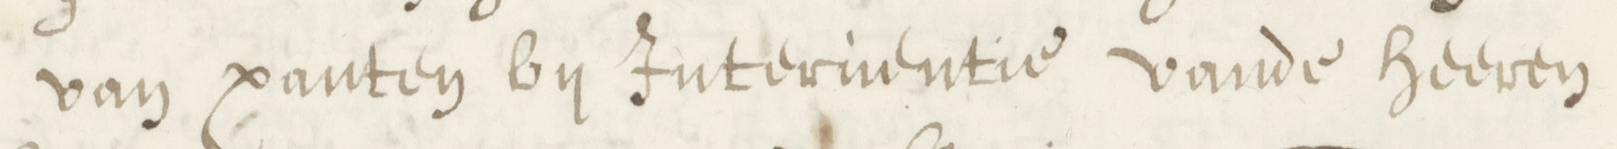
van Xanten bij Interuentie vande heeren
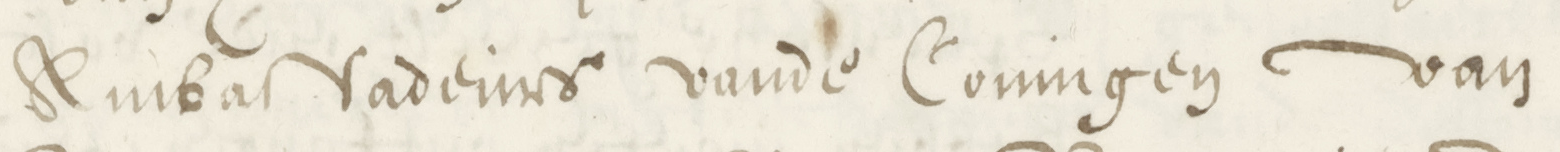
Amabassadeurs vande Coningen van
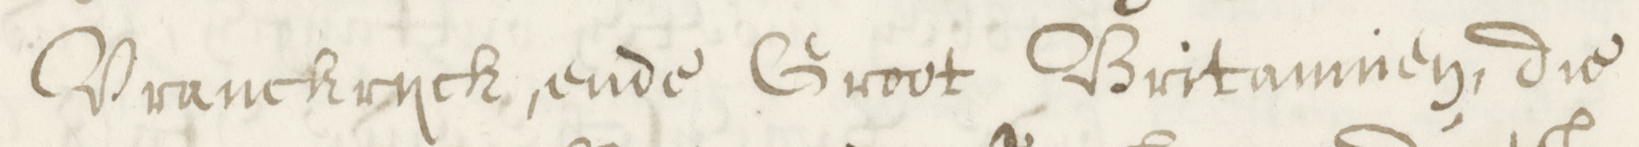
Vranckryck, ende Groot Britannien, die
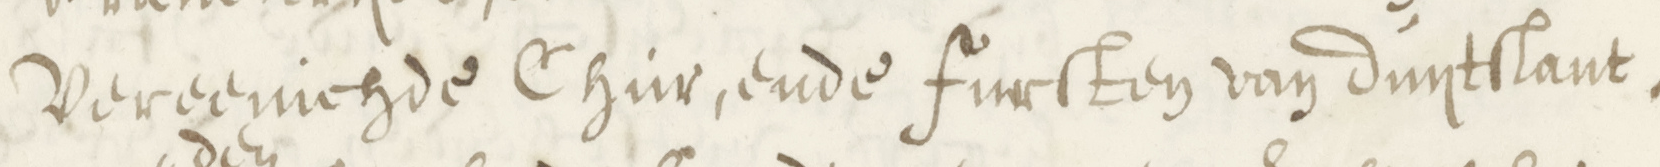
Vereenichde Chur, ende fursten van Duytslant,
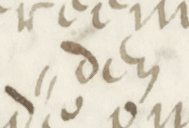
,,den
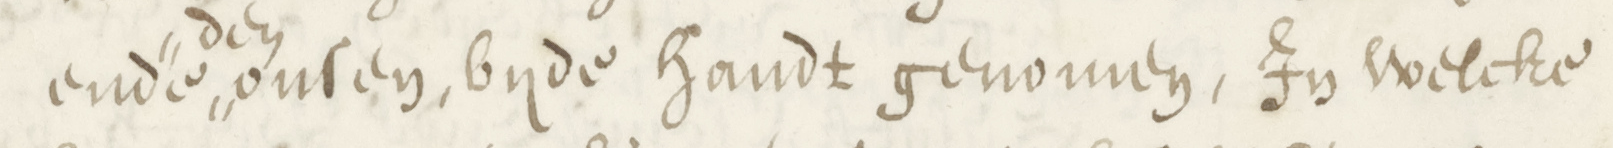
ende ,, onsen, byde handt genomen, In welcke
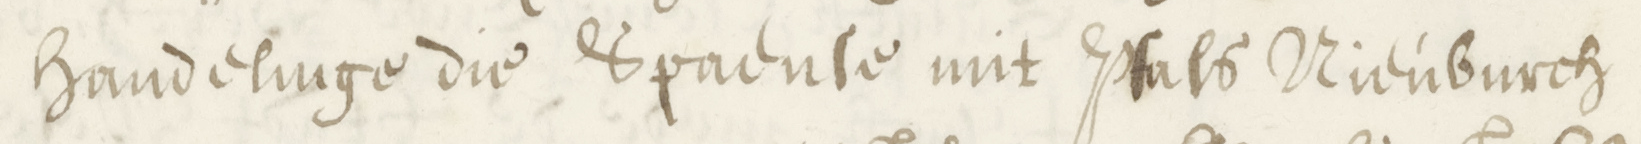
handelinge die Spaense mit Pfals Nieuburch
